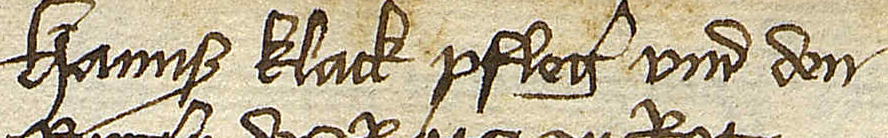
Hannſ* klack pfleg* vnd den
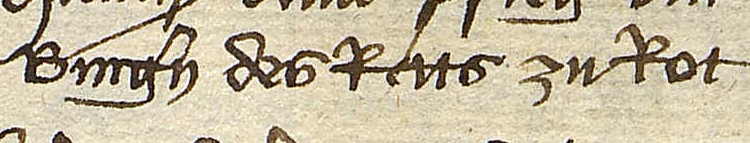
Burg*n des Rats ʒu Rot
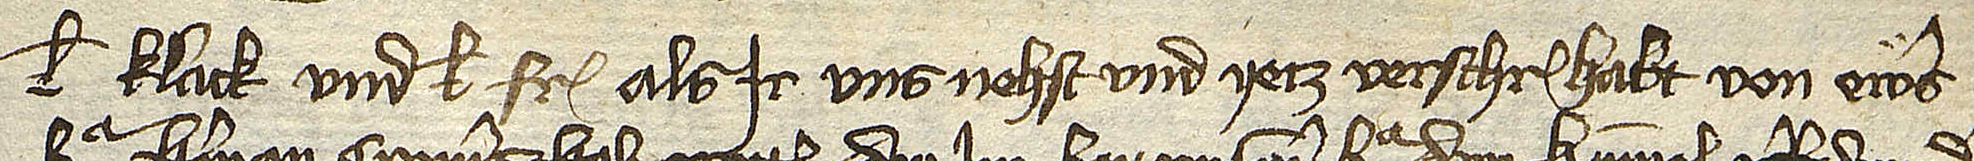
L* klack vnd l* fr* als Ir vns nehſt vnd yecʒ verſchr* habt von eẅ*s
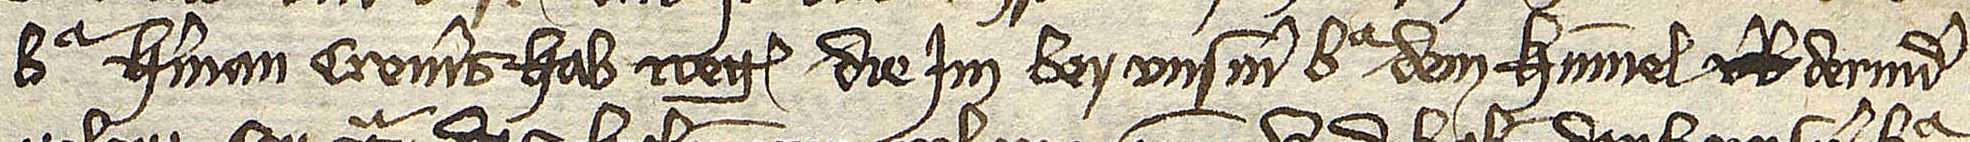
b* h*man Crem*s hab weg* / die Im bey vnſm* b* / dem hum*el v*b dernid*
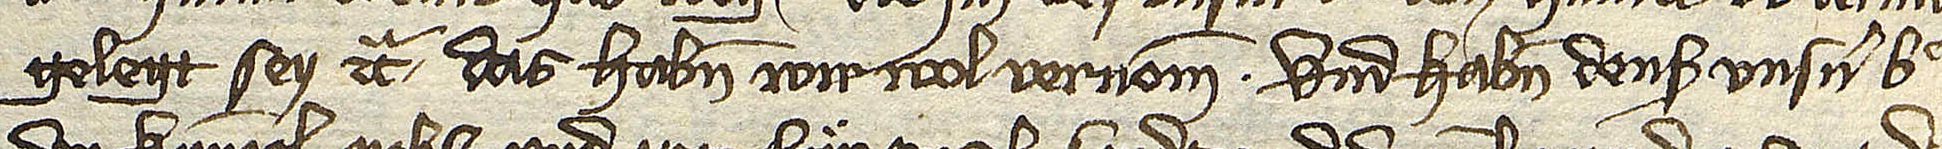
gelegt ſey ec* / das habn* wir wol vernom* . Vnd habn* denſ* vnſn* b*
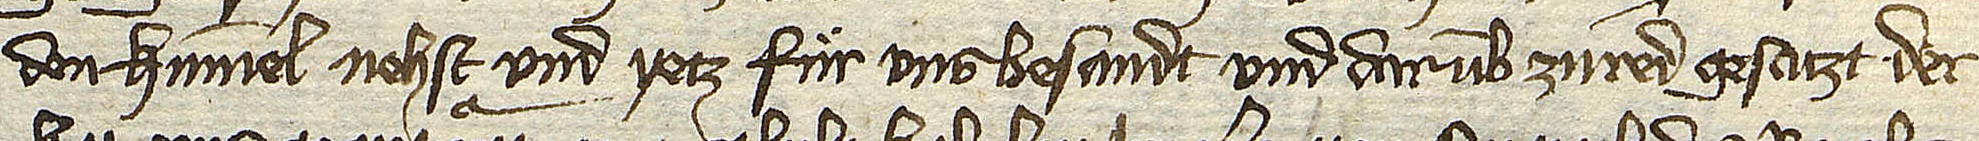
den hum*el nehſt vnd yecʒ für vns beſandt vnd darub* ʒured geſacʒt . der
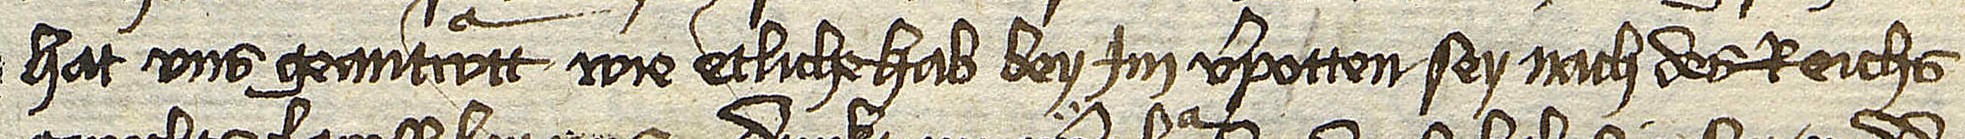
hat vns geantw*tt / wie etliche hab bey Im v*potten ſey nach des Reichs
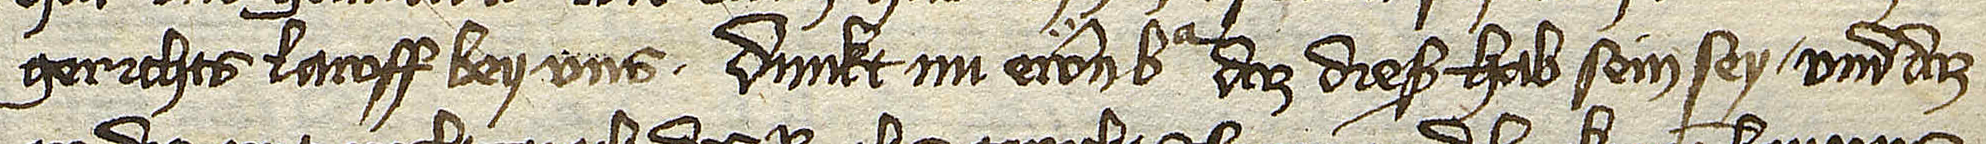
gerichts lawff bey vns / Dunkt nu eẅ*n b* daʒ dieſ* hab ſein ſey / vnd daʒ
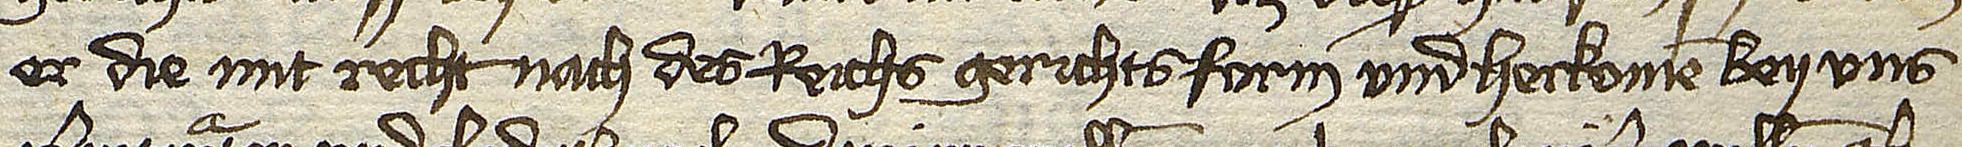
er die mit recht nach des Reichs gerichts form vnd herkome* bey vns
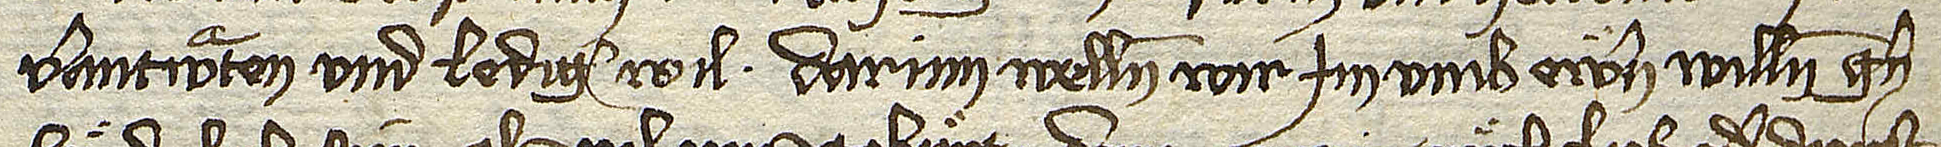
v*antw*ten vnd ledig* wil . Darinn welln* wir Im vmb eẅ*n willn* g*n
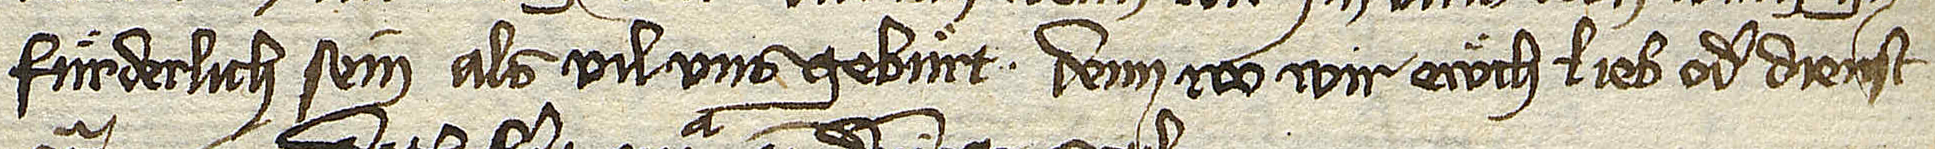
fürderlich ſein als vil vns gebürt . Denn wo wir eẅch lieb od* dienſt
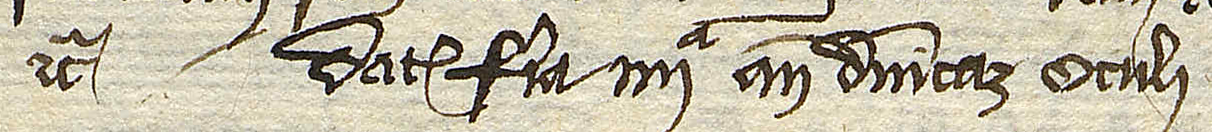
ec* / Dat* fi*a iiii* an* d*nica* Oculi
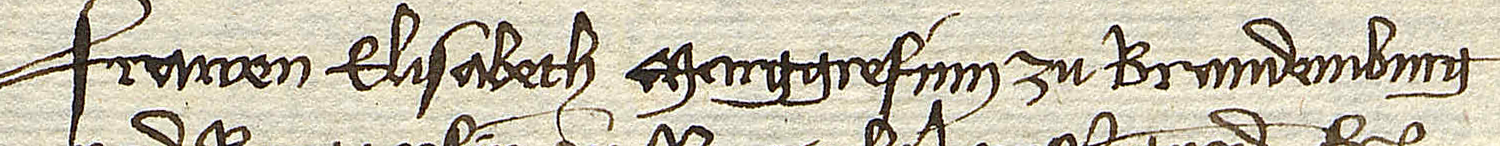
Frawen Eliſabeth Marggrefin ʒu Brandemburg
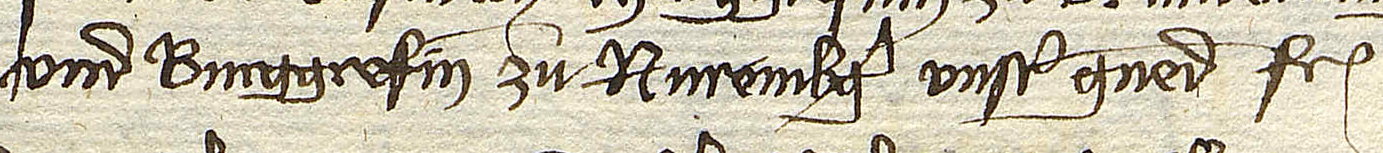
vnd Burggrefin ʒu Nuremb*g vnſr* gned* fr*
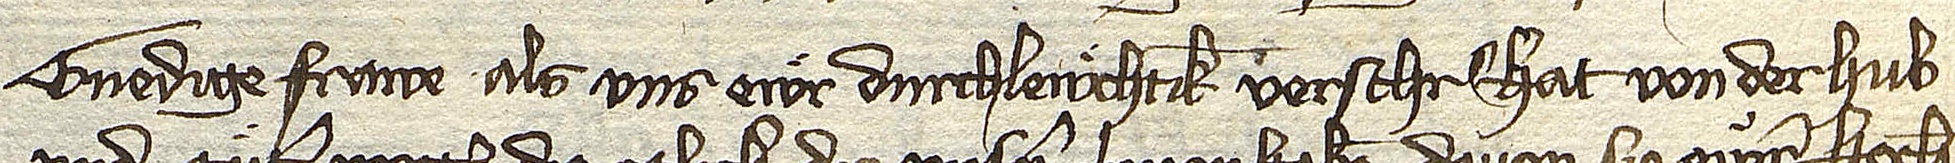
Gnedige frawe als vns eẅr durchleẅchtik* verſchr* hat von der hub
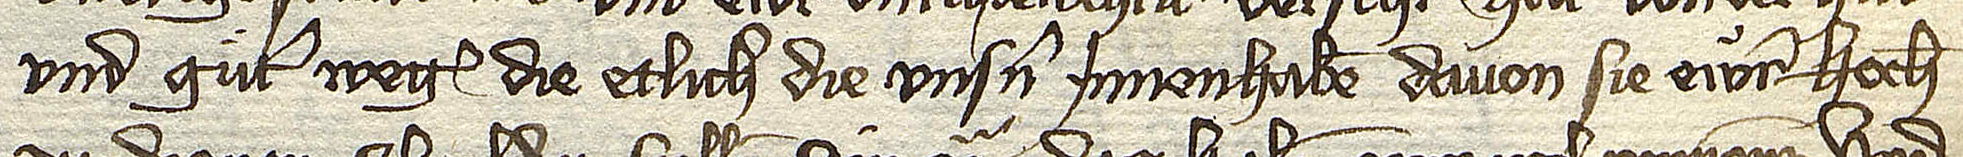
vnd güt* weg* die etlich die vnſn* Innenhabe* dauon ſie eẅr* Hoch*
